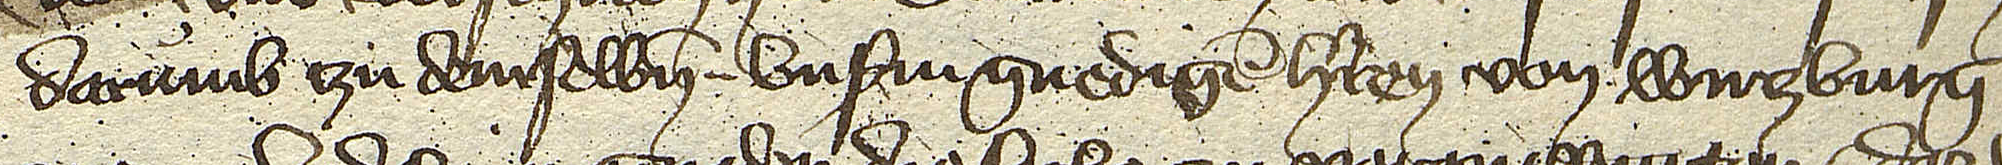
darümb cʒu demſelbn* ~ vnſ*m gnedige* hr*en von wircʒburg
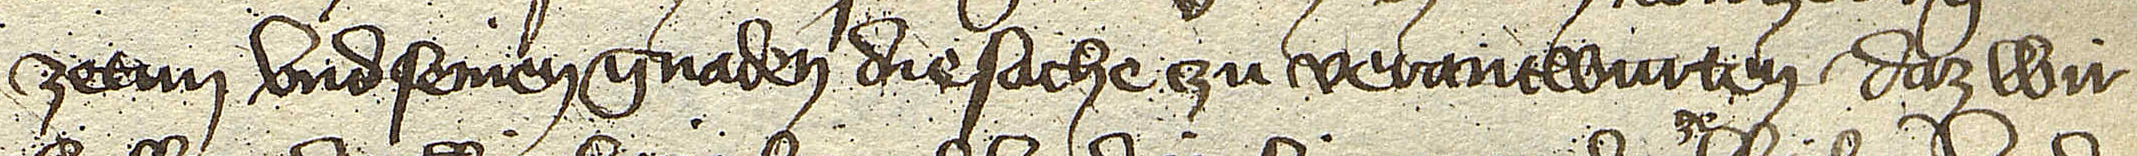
cʒetun vnd ſeinen gnaden die ſache cʒu verantwurten / daʒ wir
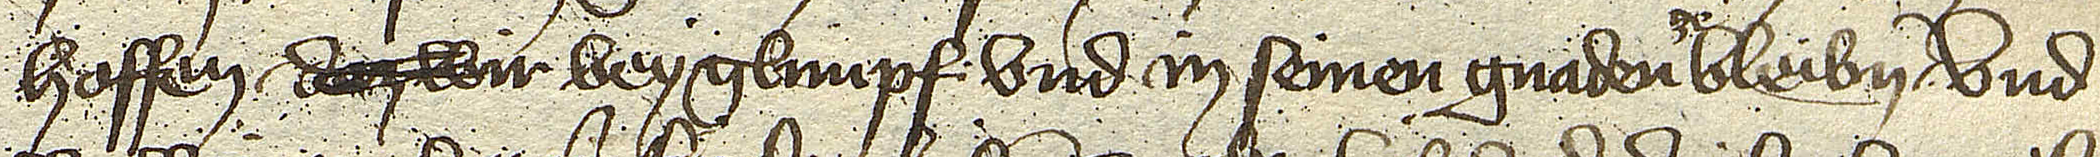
hoffen / daʒ wir bey glimpf vnd in ſeinen gnaden bleibn* / vnd
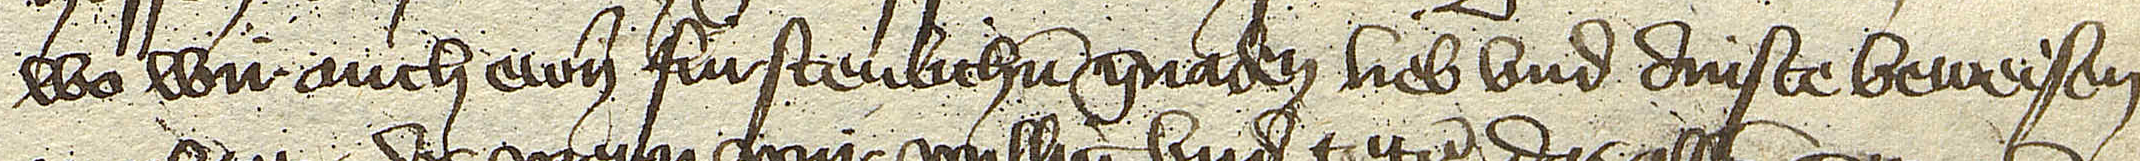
wo wir auch ewn* fürſtenlichn* gnaden lieb vnd dinſte beweiſen
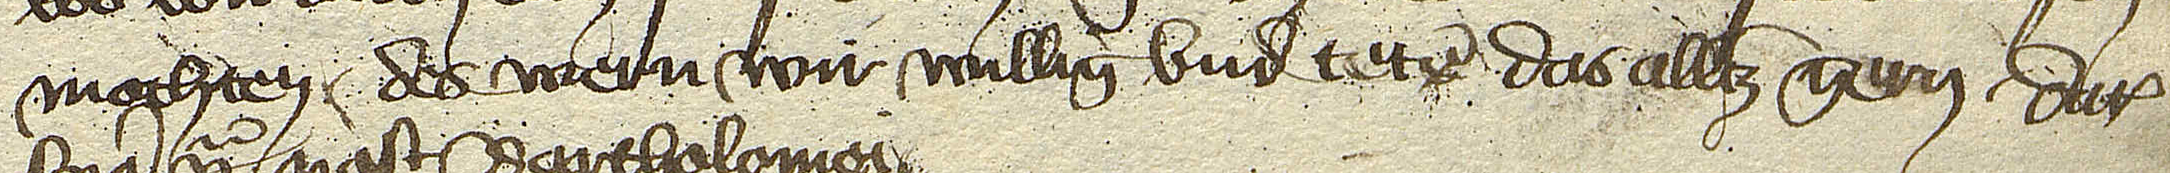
mochten / des wern wir willig vnd tete* das allcʒ* gern / dat*
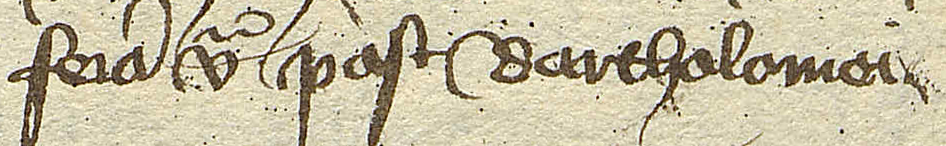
feia* v* poſt Bartholomei
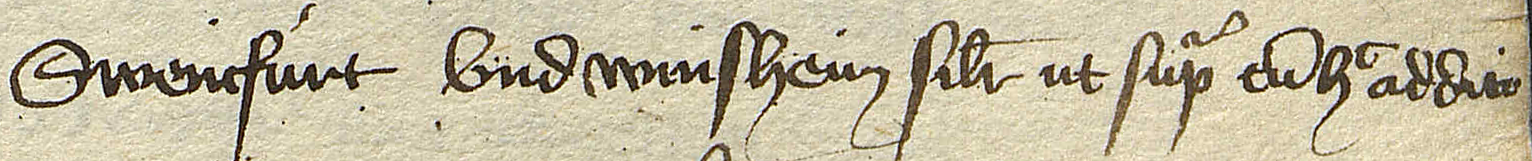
Sweinfurt vnd winſheim ſilr* ut ſup* cu* h* addito
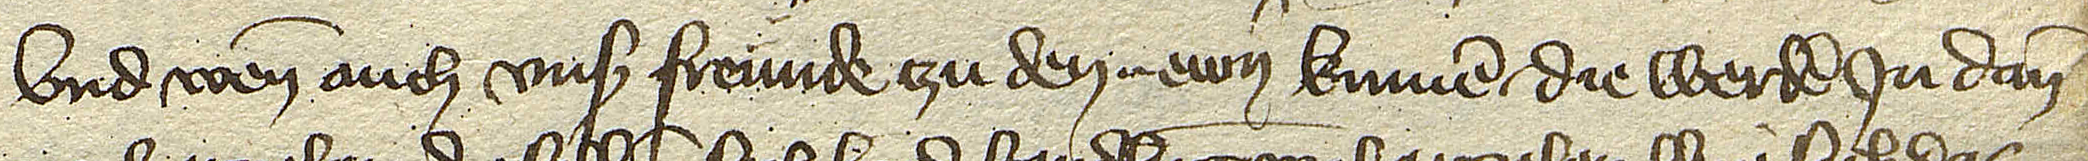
vnd wen* auch vnſ* freunde cʒu den ~ ewn* kume* / die werde* In dan*
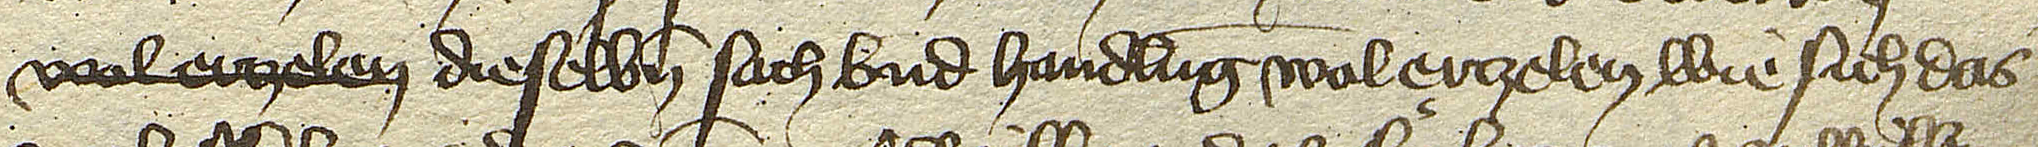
wol ercʒelen dieſelbn* ſach vnd handlug* wol ercʒelen wie ſich das
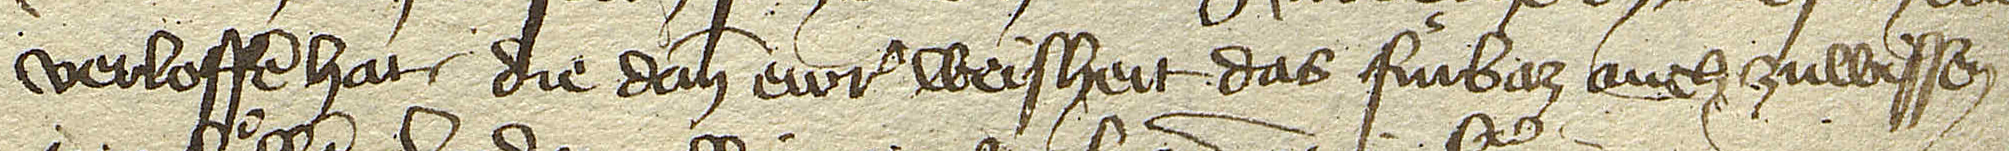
verloffe* hat / die dan* ewr* weiſheit das fürbaʒ auch cʒuwiſſen
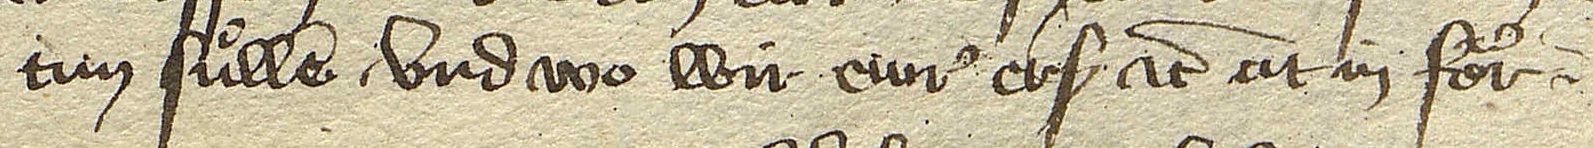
tun ſülle* / vnd wo wir ewr* erſ* ec* ut in for*
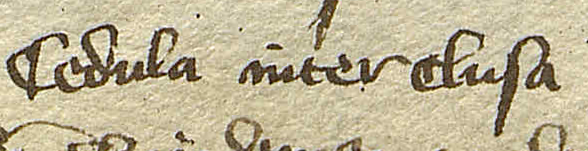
Cedula interCluſa
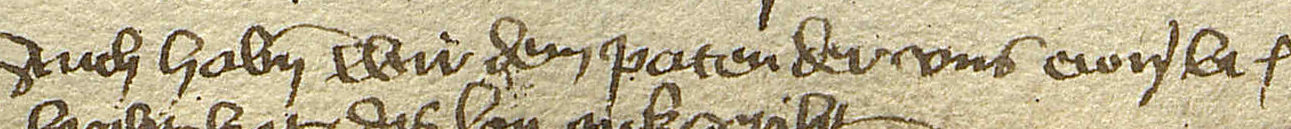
Auch habn* wir dem poten der vns ewn br*
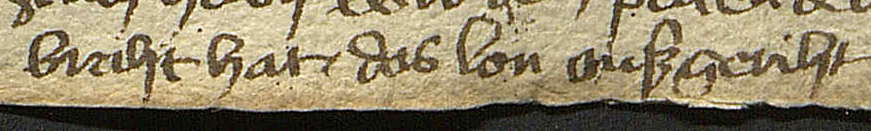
braht hat / das lon auſʒgeriht
